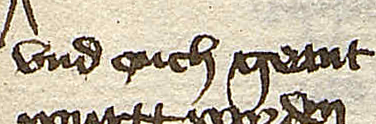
vnd euch geant
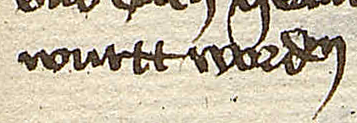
wurtt worden
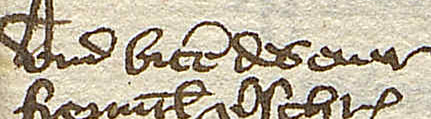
vnd bite* des ewr
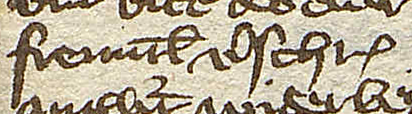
freuntl* v*ſchr*
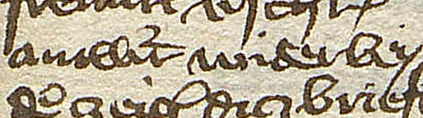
antw*t wider bey
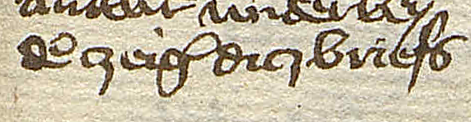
d* cʒeig* dicʒ briefs
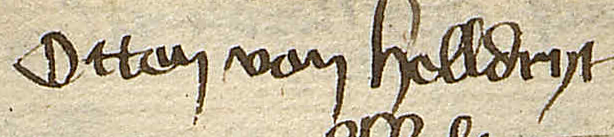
Otten von Helldryt
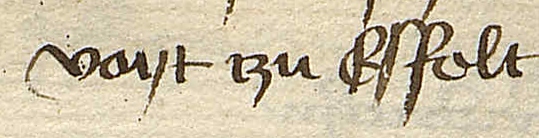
vayt cʒu Eſfelt
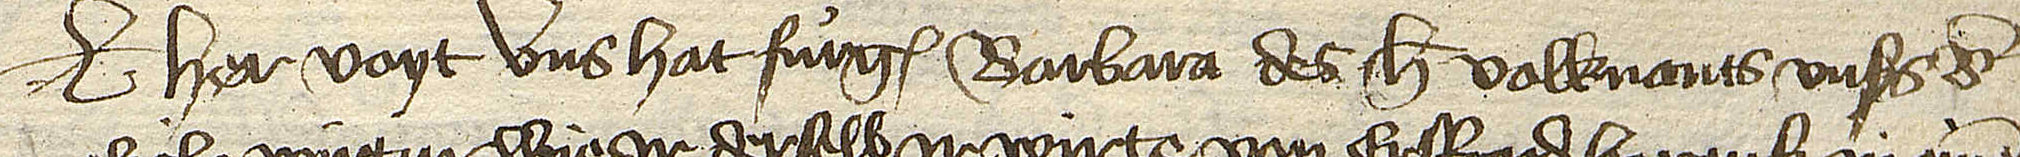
L* her vayt Vns hat fürg* Barbara des h* volknants vnſ*s B*
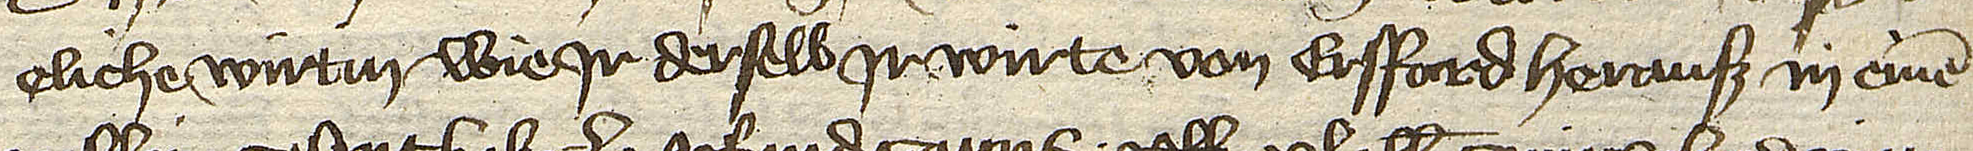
eliche wirtin / wie Ir derſelb Ir wirte von Erfford herauſʒ in eine*
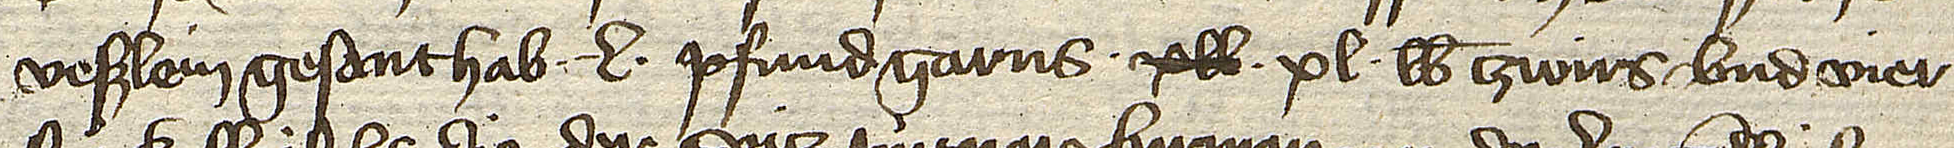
veſʒlein geſant hab . l . pfund garns . xll . xl . lb cʒwirs / vnd vier
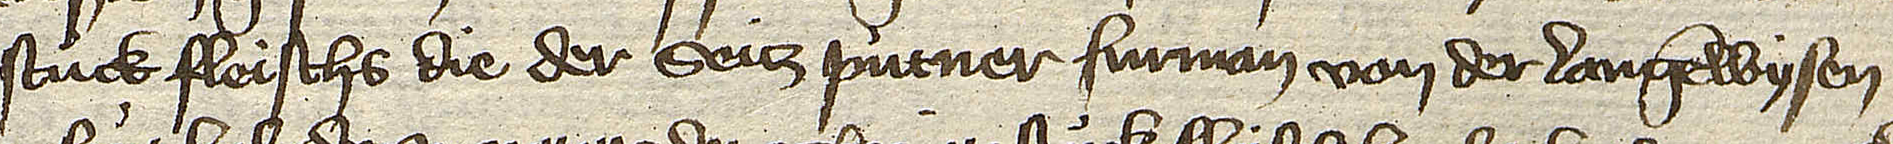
ſtück fleiſchs die der Seicʒ pütner furman von der lange*wyſen
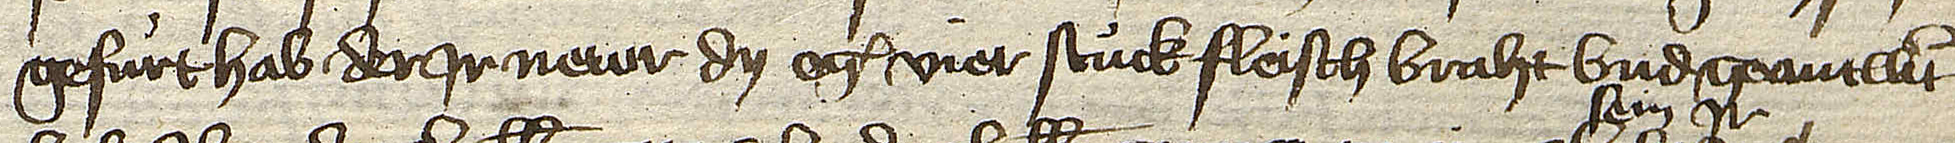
gefürt hab / der Ir newr dy eg* vier ſtück fleiſch braht vnd geantw*t
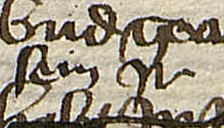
ſein Ir
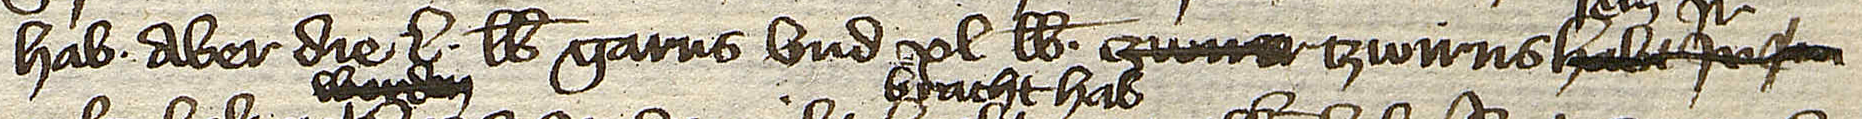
hab . Aber die . l . lb garns vnd xl lb . cʒwir cʒwirns habt Ir Im
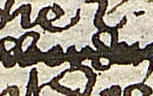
worden
